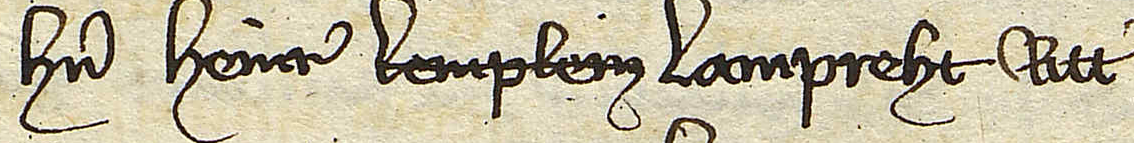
hn* heinr* Lemplein Lampreht Ritt*
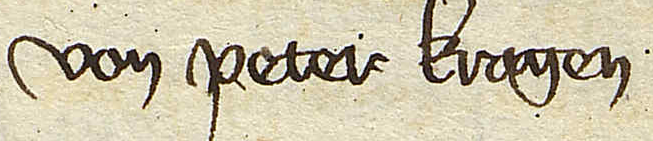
von peter Kragen
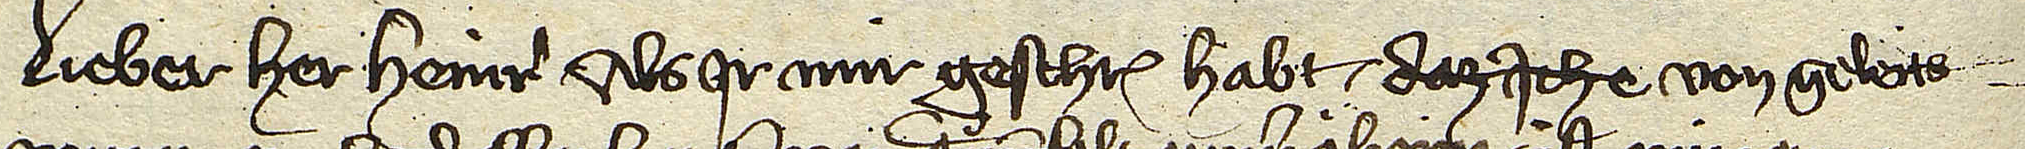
Lieber her heinr* / Als Ir mir geſchr* habt / daʒ Ich e von geleits
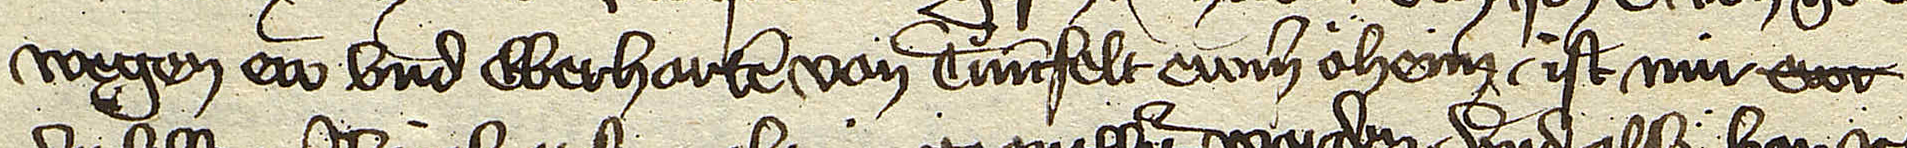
wegen ew vnd Eberharte* von Tün*felt ew*m öheim / iſt mir ewr
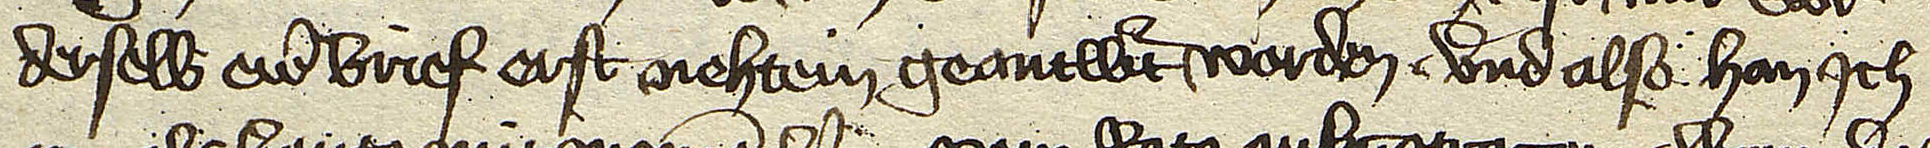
derſelb ew* brief erſt nehtein geantwt* worden / vnd alſo han Ich
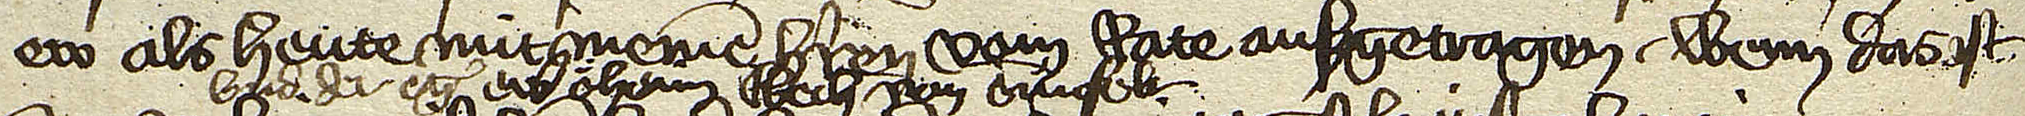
ew als heute mit meine* h*ren vom Rate auſʒgetragen / wenn das iſt
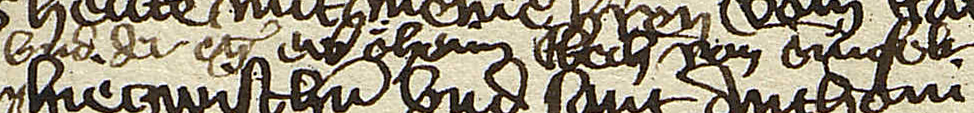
vnd der eg* ew* öheim Eberh* von Tünfelt
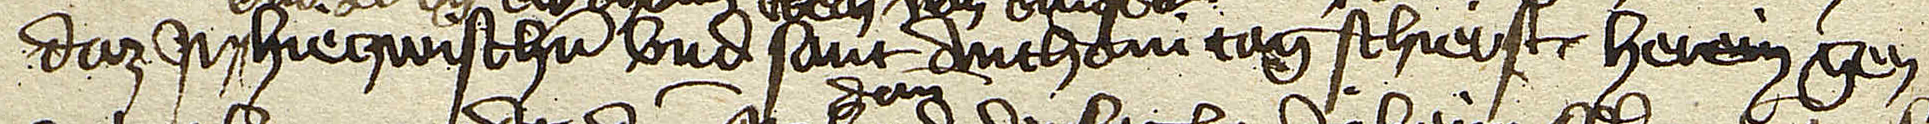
daʒ Ir hiecʒwiſchn* vnd ſant Anthoni tag ſchierſt / herein gen
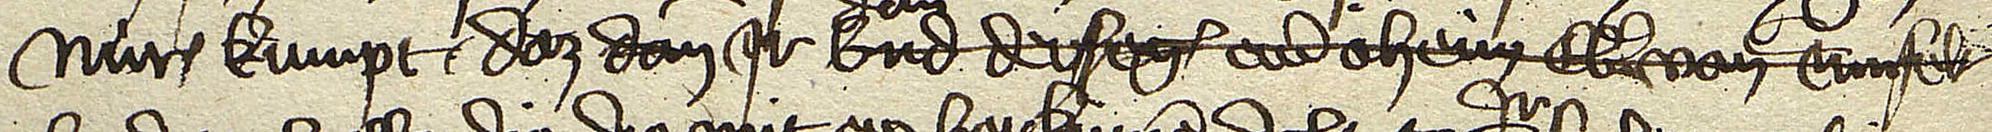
Nür* kumpt / daʒ dan* Ir vnd derſ* eg* ew* öheim Eb* von Tunfelt
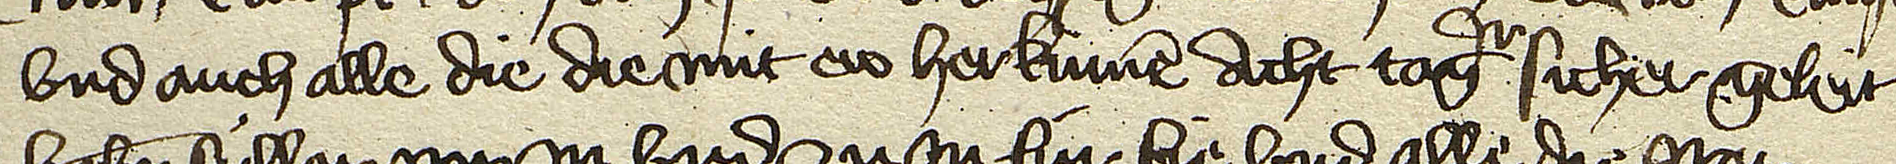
vnd auch alle die die mit ew herkume* Acht tag ſicher geleit
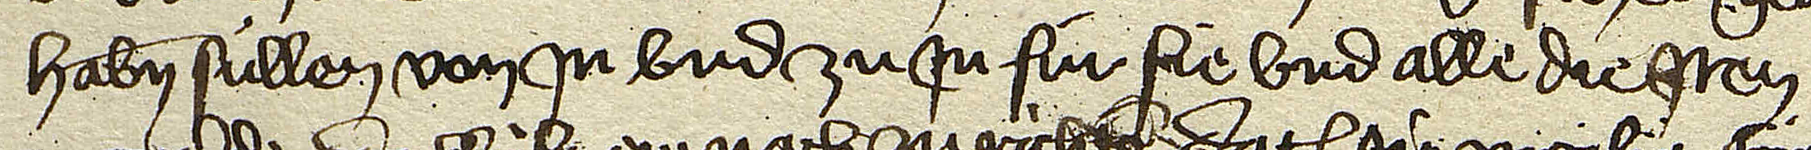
habn* ſüllen von In vnd cʒu In für ſie vnd alle die Iren
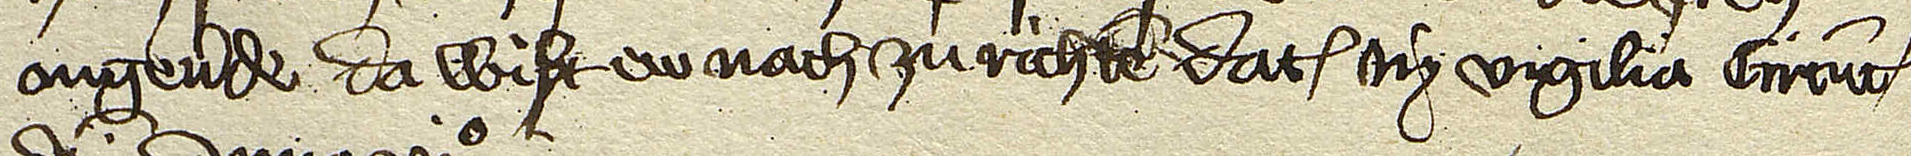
ongeu*de / da wiſʒt ew nach cʒu richte* / dat* in vigilia Circu*c*
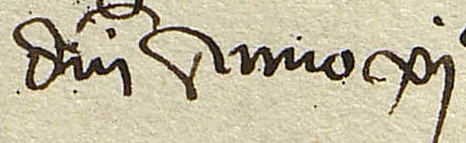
dni* Anno xi*
